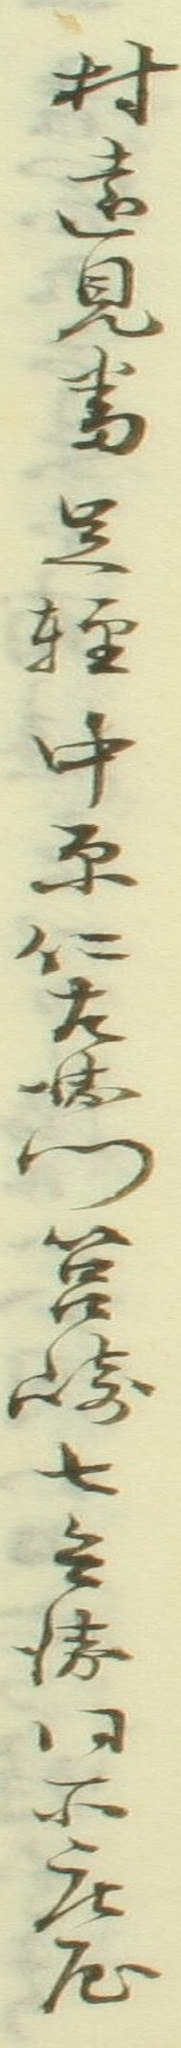村遠見番足軽中原仁左衛門箱崎七兵衛同所庄屋
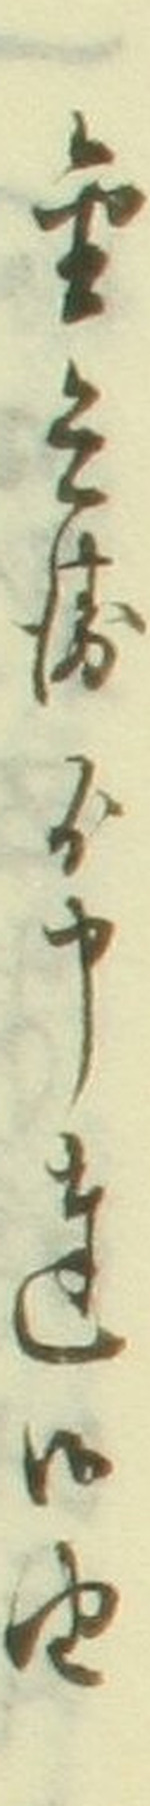金兵衛ゟ申達候由

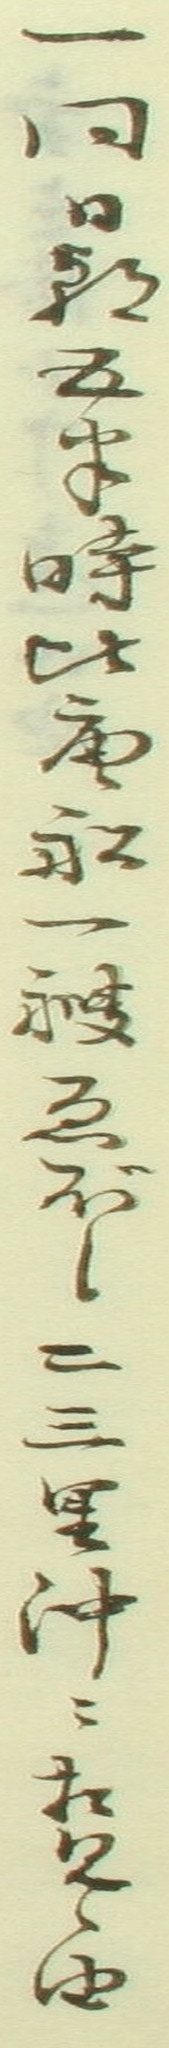一同日朝五半時比唐船一艘ゑぼし二三里沖に相見候由
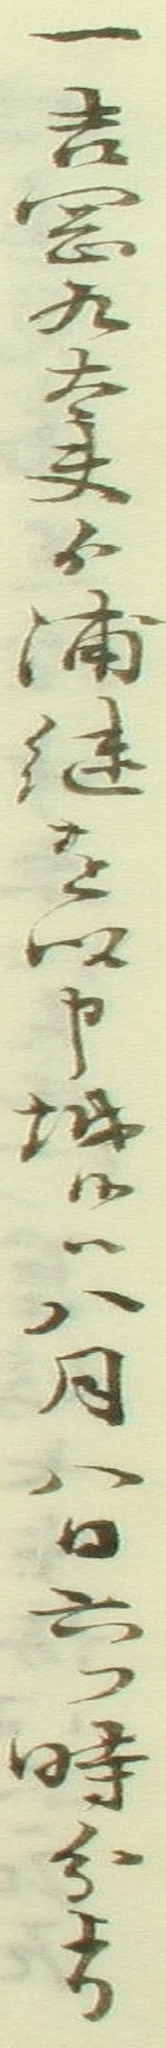一吉岡九太夫ゟ浦継を以申越候は八月八日六ッ時分より
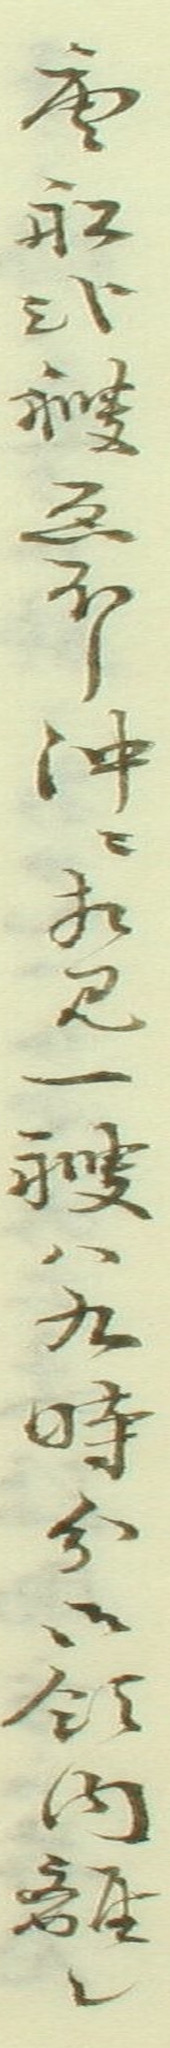唐船弐艘ゑほし沖に相見一艘は九時分御領内離れ
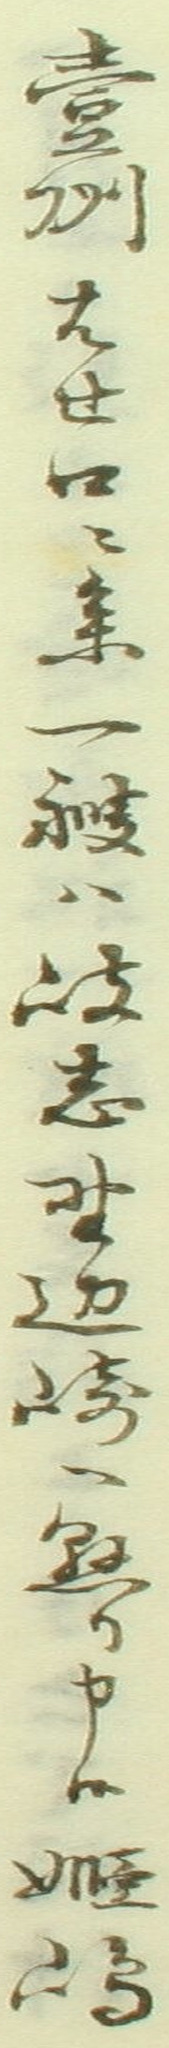壱州はせ口に参一艘は岐志野辺崎へ懸り申候姫島
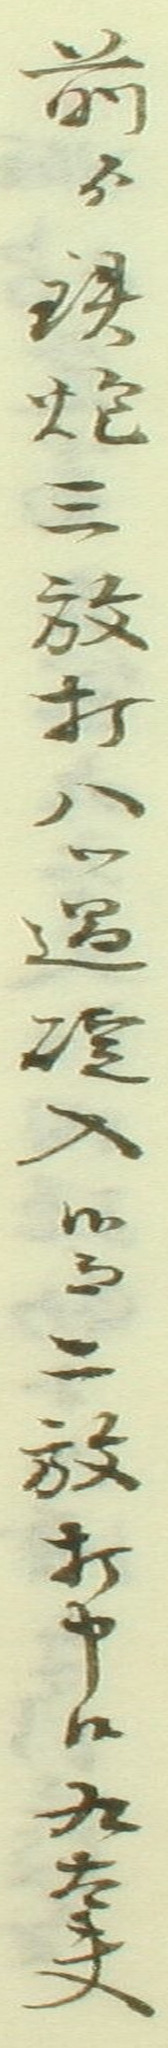前ゟ鉄炮三放打ハツ過碇入候而二放打申候九太夫
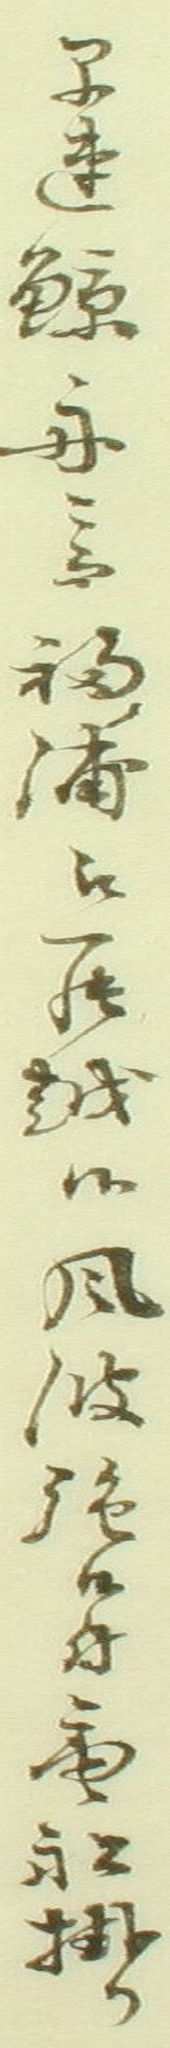早速鯨舟に而福ノ浦え罷越候風波強候付唐船掛り
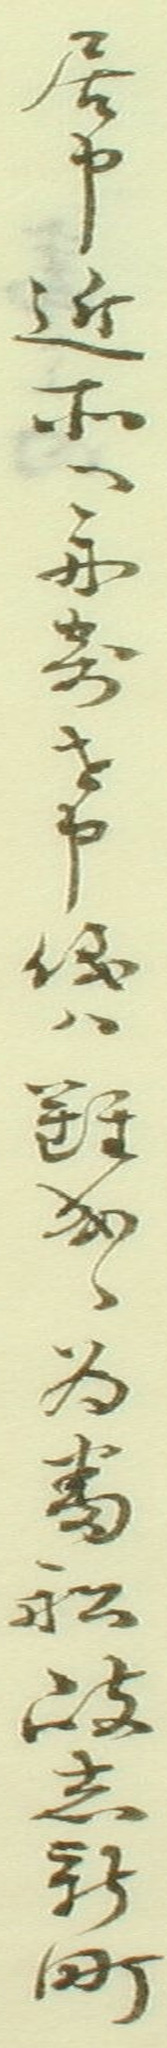居申近所へ舟寄せ申儀は難成候為番船岐志新町
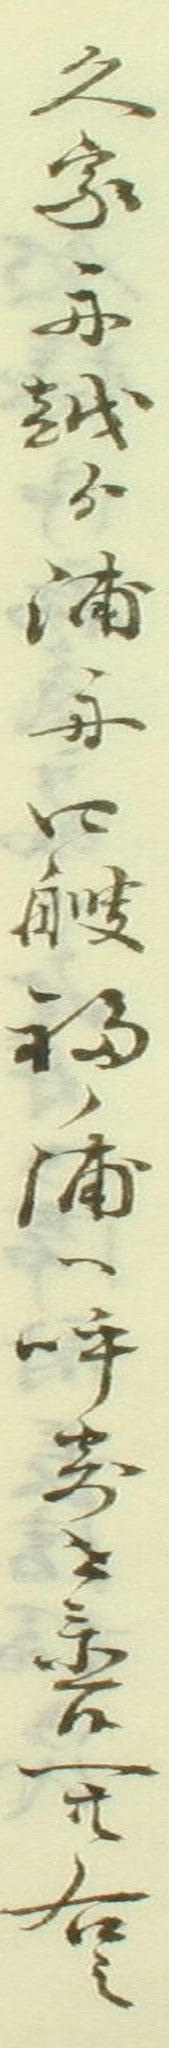久家舟越ゟ浦舟四艘福ノ浦へ呼寄せ置候へ共右之
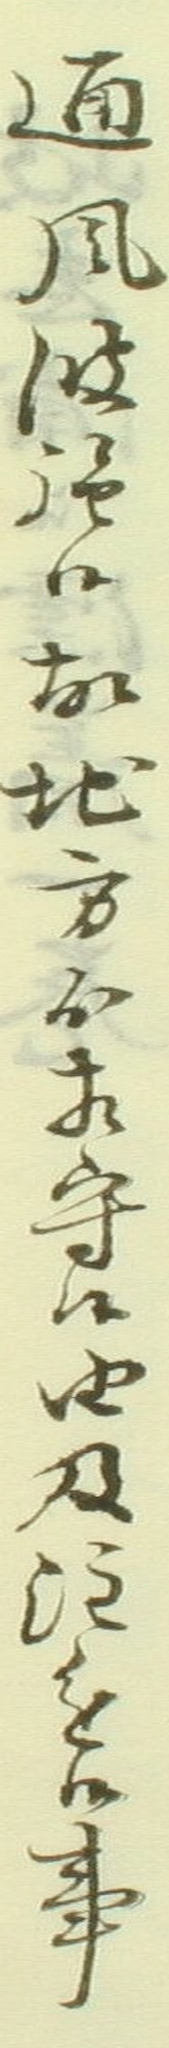通風波強候故北方ゟ相守候由及注進候事
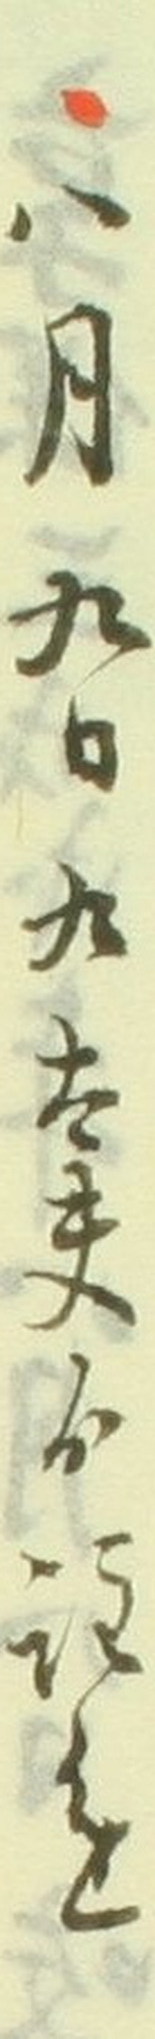八月九日九太夫ゟ注進
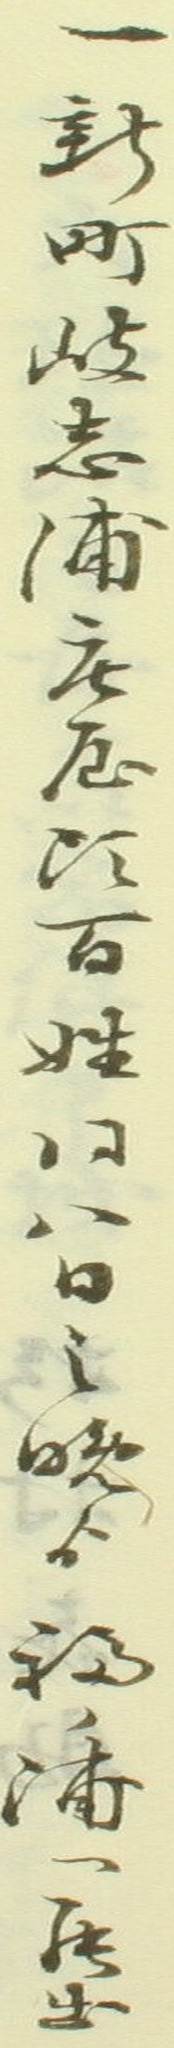一新町岐志浦庄屋頭百姓同八日之晩ゟ福ノ浦へ罷出
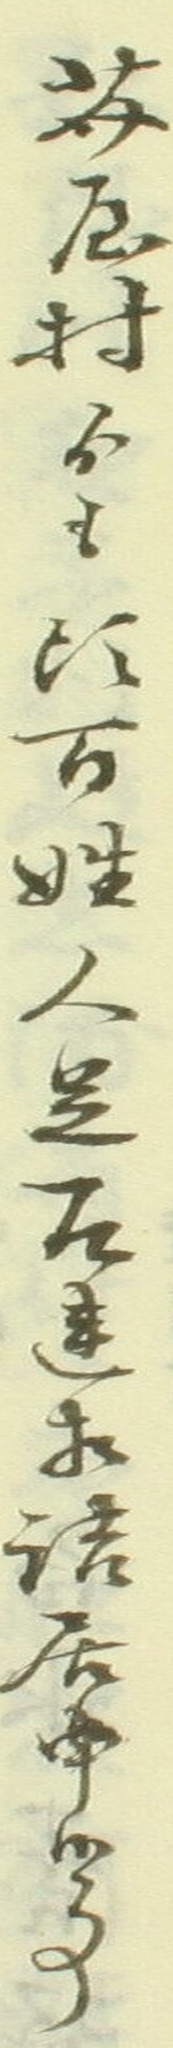芥屋村ゟも頭百姓人足召連相詰居申候事
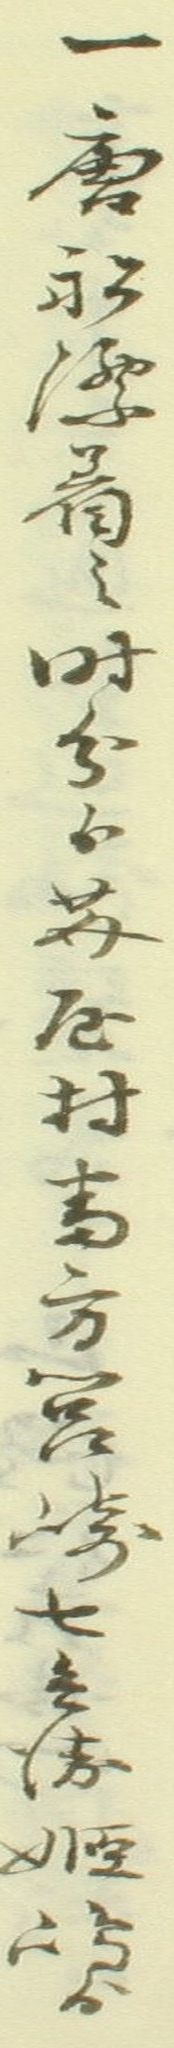一唐船漂着之時分ゟ芥屋村番方筥崎七兵衛姫島ゟ
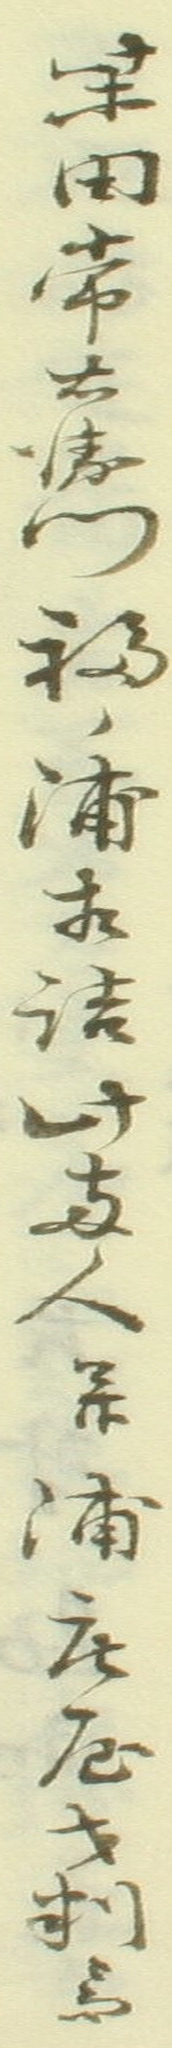柴田常右衛門福ノ浦相詰此両人并浦庄屋才判に而
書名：異国船漂着記
